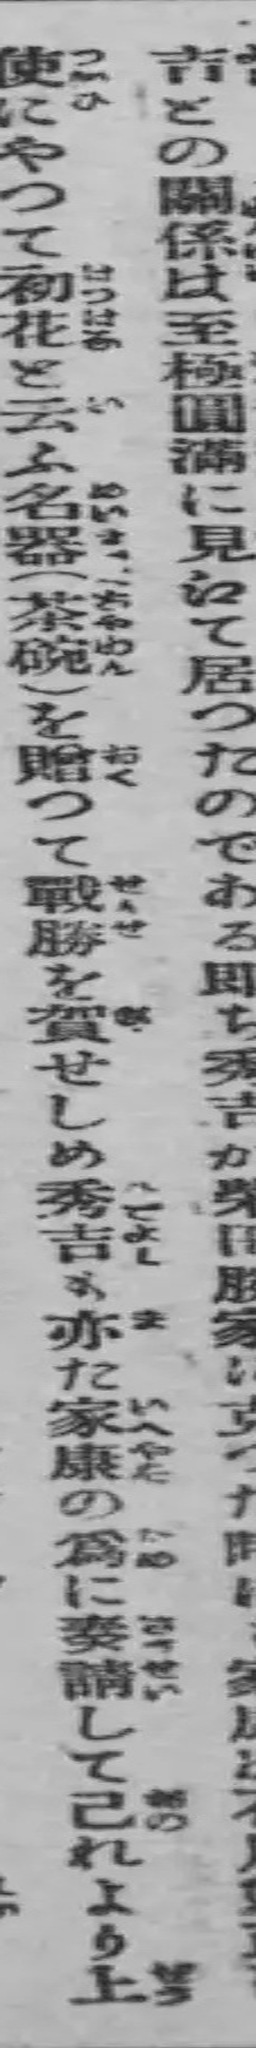使にやつて初花と云ふ名器(茶碗)を贈つて戦勝を賀せしめ秀吉も亦た家康の為に奏請して己れより上
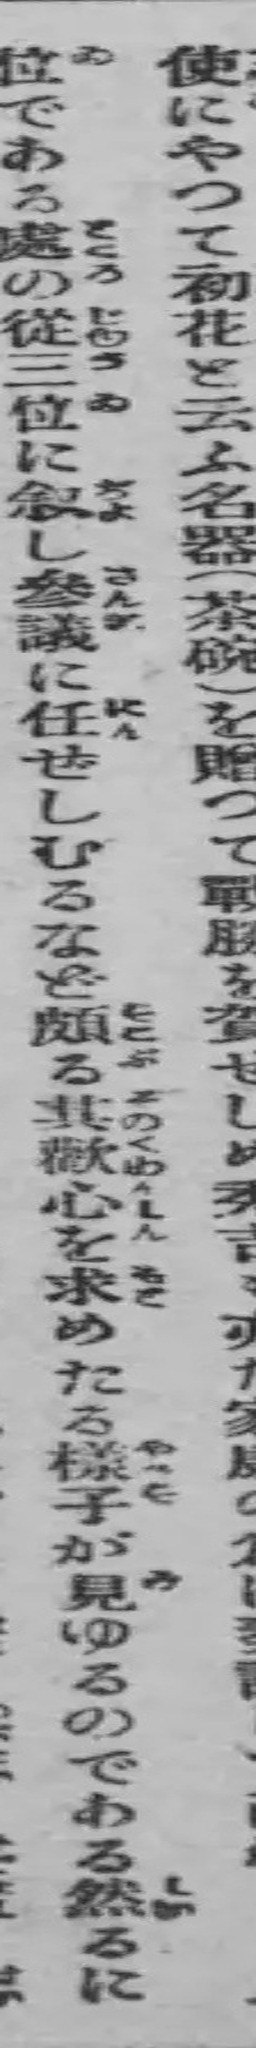位である処の従三位に叙し参議に任ぜしむるなど頗る其歓心を求めたる様子が見ゆるのである然るに
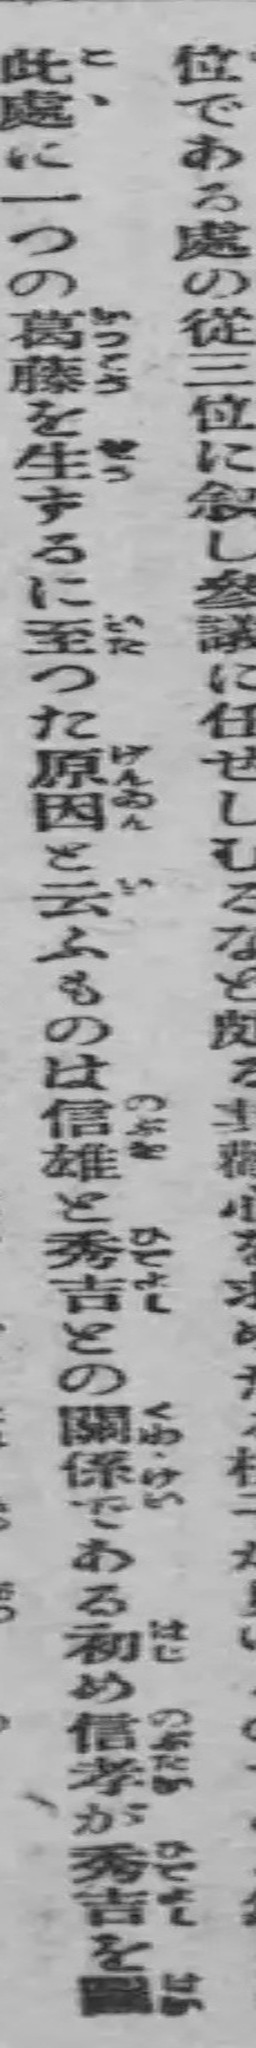此処に一つの葛藤を生ずるに至つた原因と云ふものは信雄と秀吉との関係である初め信孝が秀吉を図
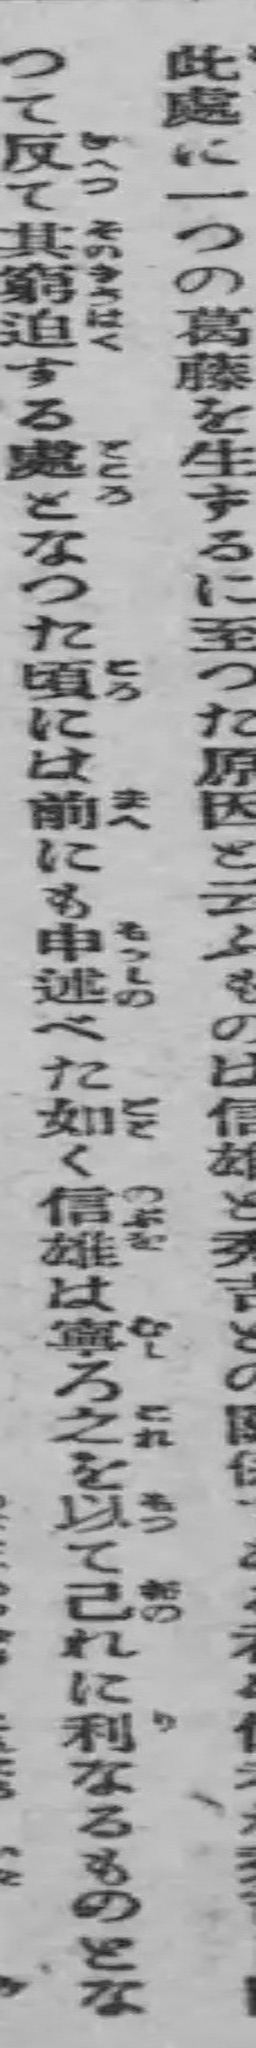つて反て其窮迫する処となつた頃には前にも申述べた如く信雄は寧ろ之を以て己れに利なるものとな
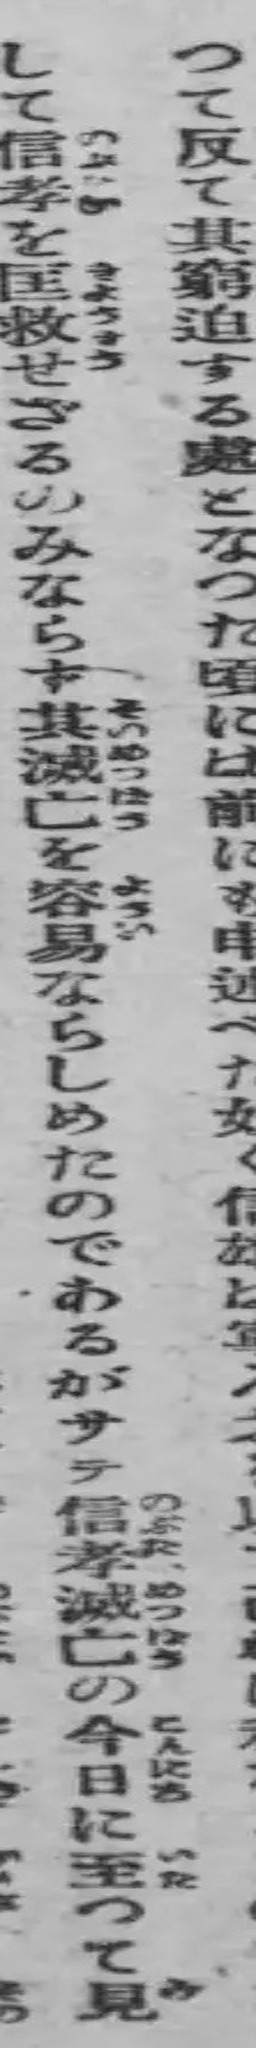して信孝を匡救せざるのみならず其滅亡を容易ならしめたのであるがサテ信孝滅亡の今日に至つて見
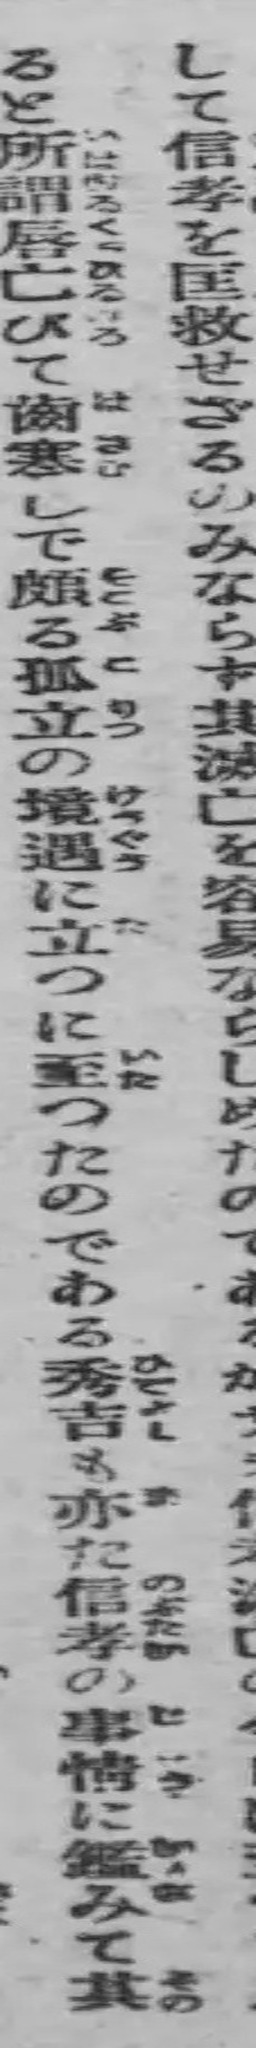ると所謂唇亡びて歯寒しで頗る孤立の境遇に立つに至つたのである秀吉も亦た信孝の事情に鑑みて其
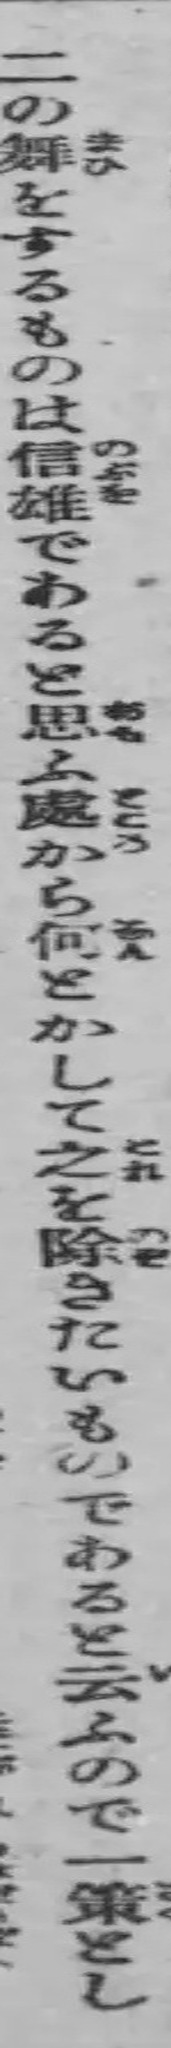二の舞をするものは信雄であると思ふ処から何とかして之を除きたいものであると云ふので一策とし
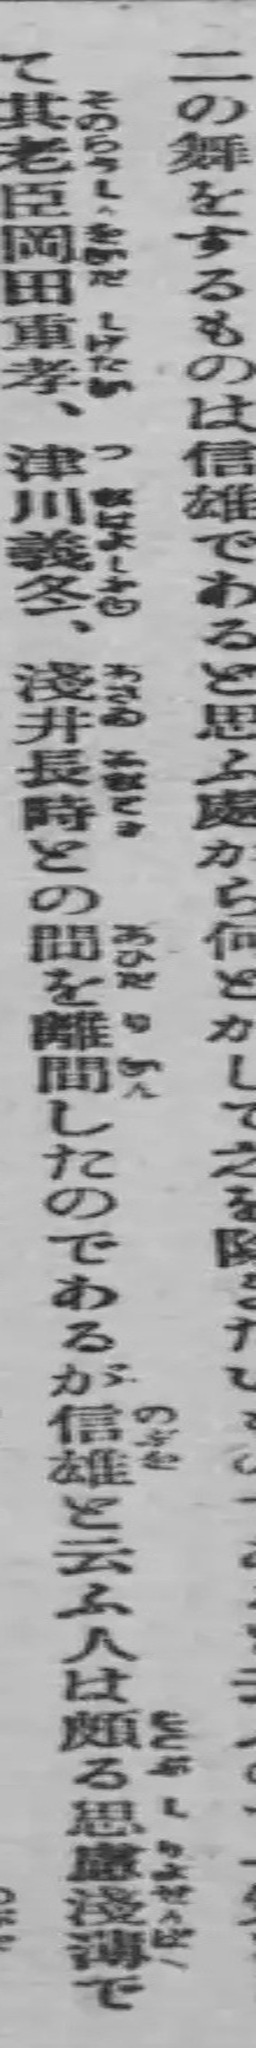て其老臣岡田重孝、津川義冬、浅井長時との間を離間したのであるが信雄と云ふ人は頗る思慮浅薄で
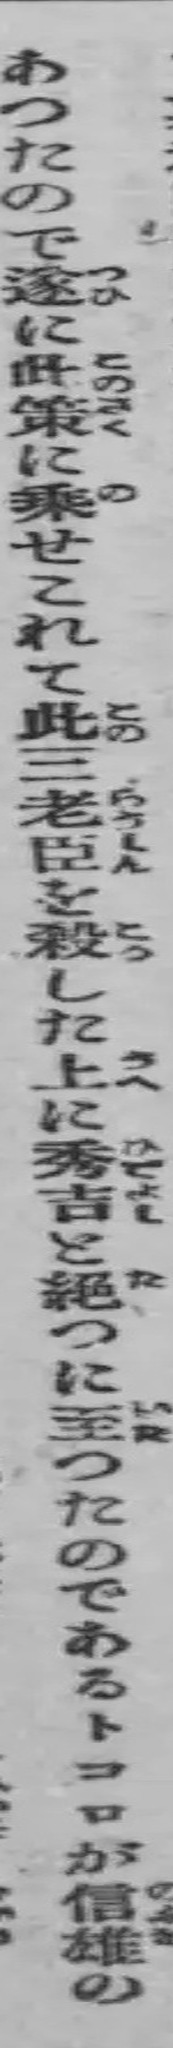あつたので遂に此策に乗せこれて此三老臣を殺した上に秀吉と絶つに至つたのであるトコロが信雄の
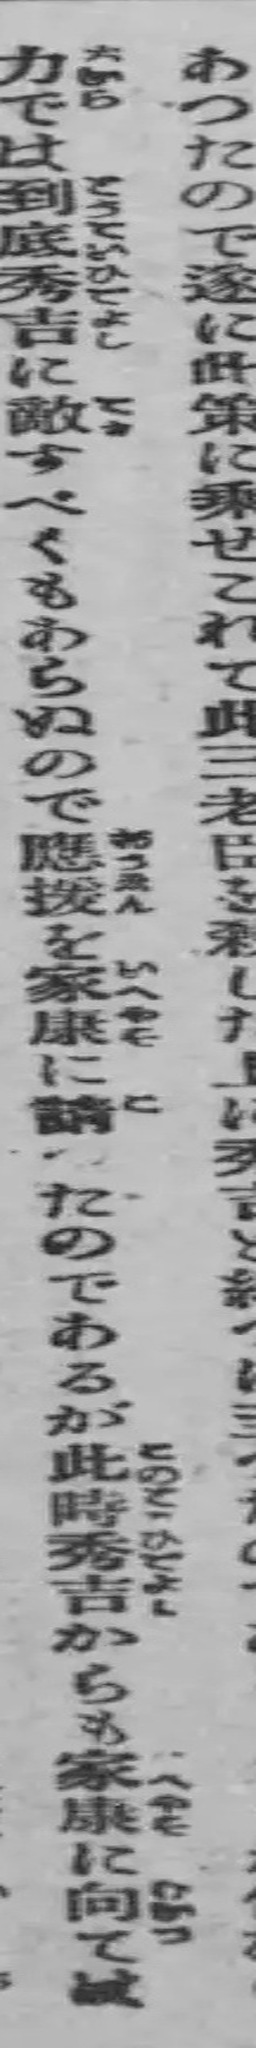力では到底秀吉に敵すべくもあらぬので応援を家康に請つたのであるが此時秀吉からも家康に向ては
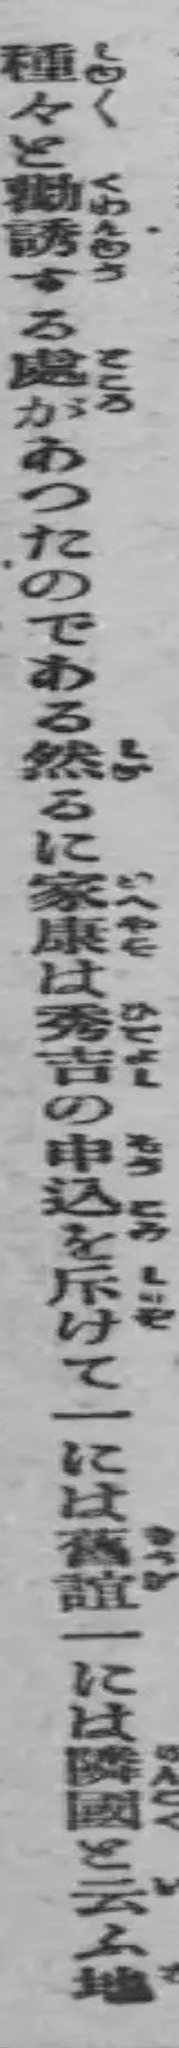種々と勧誘する処があつたのである然るに家康は秀吉の申込を斥けて一には旧誼一には隣国と云ふ地

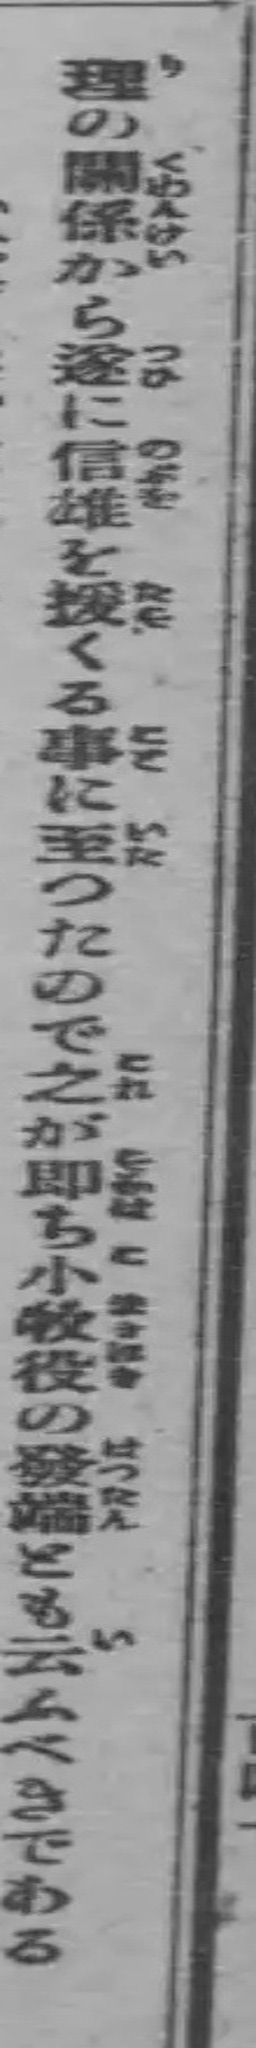理の関係から遂に信雄を援くる事に至つたので之が即ち小牧役の発端とも云ふべきである
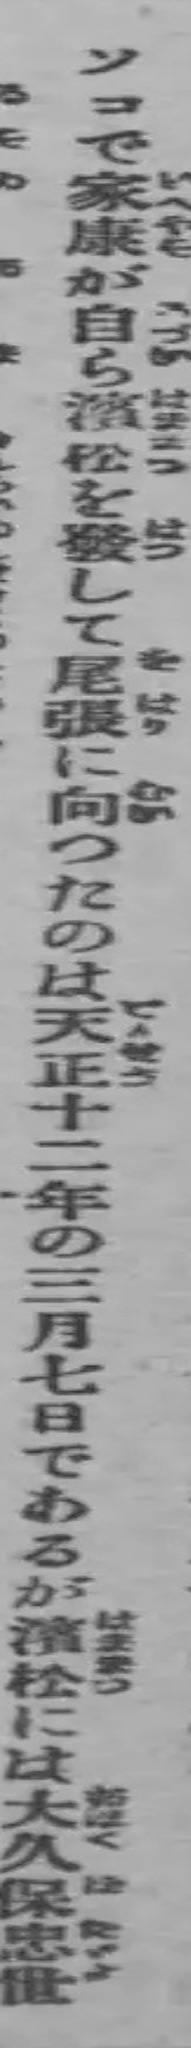ソコで家康が自ら浜松を発して尾張に向つたのは天正十二年の三月七日であるが浜松には大久保忠世
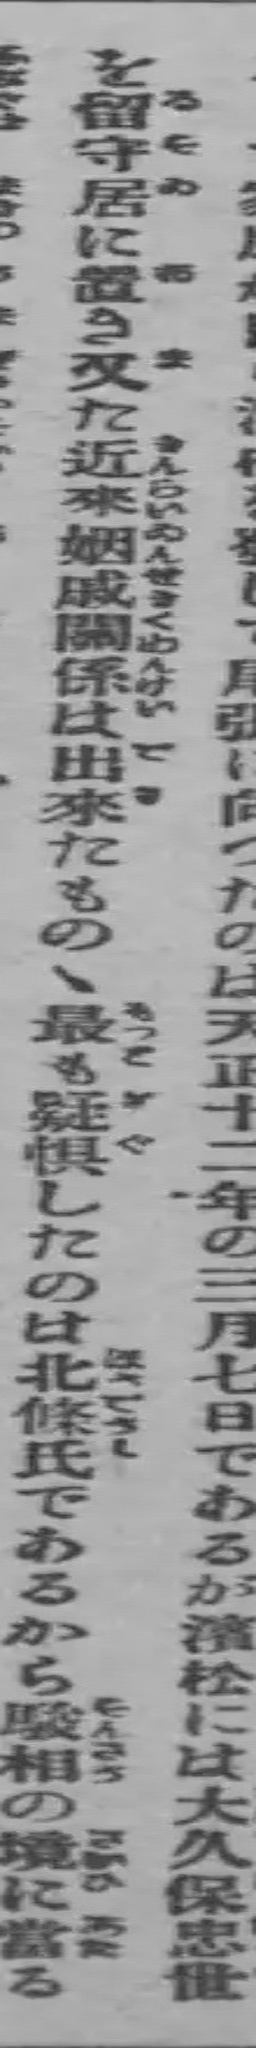を留守居に置き又た近来姻戚関係は出来たものゝ最も疑惧したのは北條氏であるから駿相の境に当る
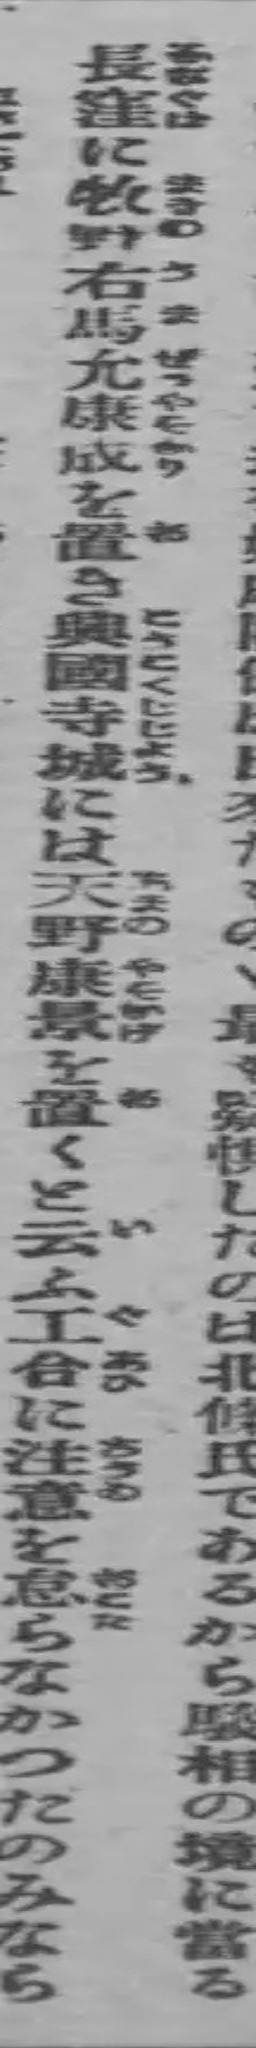長窪に牧野右馬允康成を置き興国寺城には天野康景を置くと云ふ工合に注意を怠らなかつたのみなら
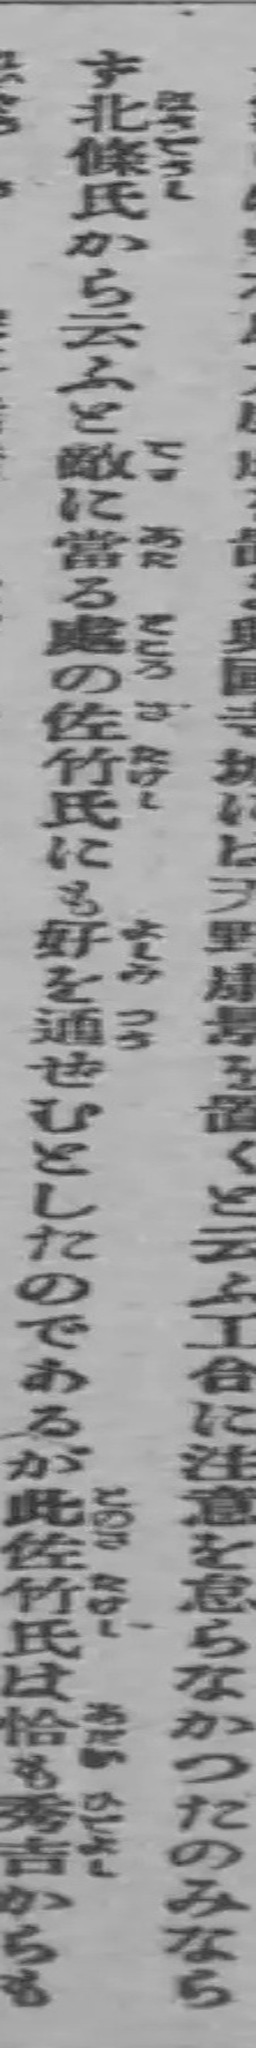ず北條氏から云ふと敵に当る処の佐竹氏にも好を通ぜむとしたのであるが此佐竹氏は恰も秀吉からも
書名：豊橋市史談
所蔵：国立国会図書館 National Diet Library, JAPAN
